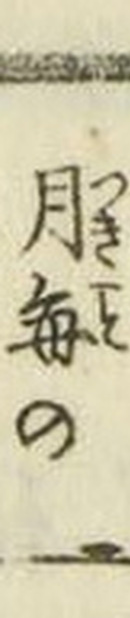月毎の
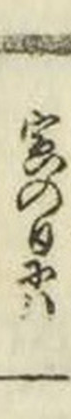寅の日には
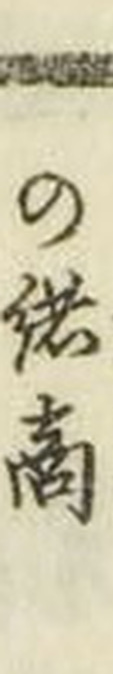の諸商
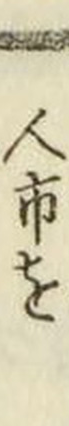人市を
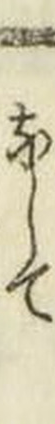なして
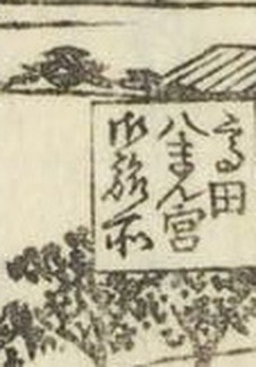御旅所
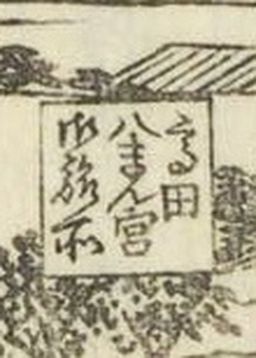八まん宮
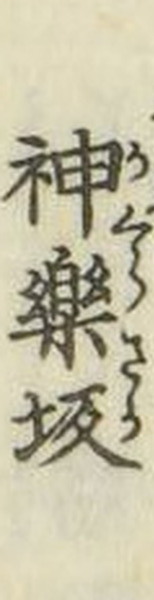神楽坂

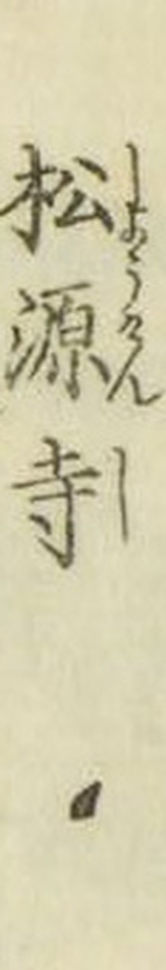松源寺
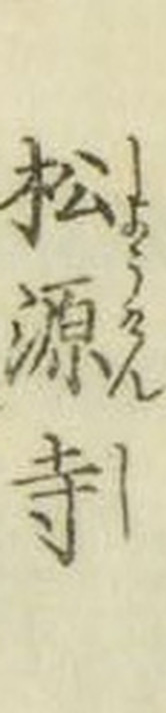松源寺
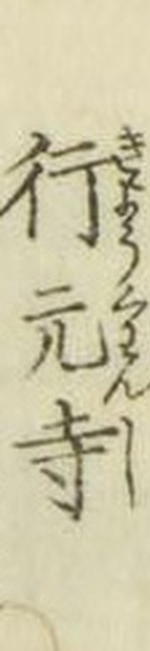行元寺
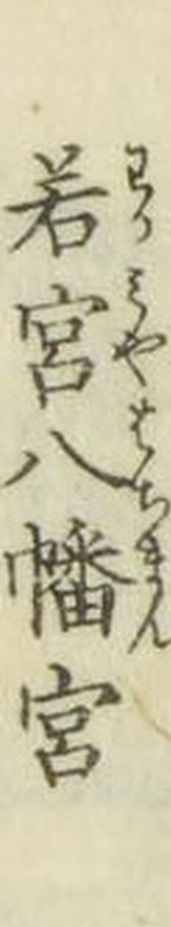若宮八幡宮
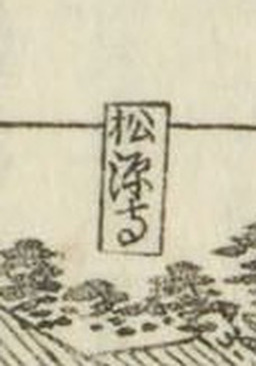松源寺
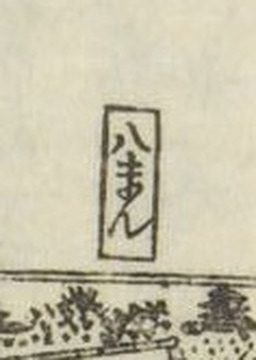八まん

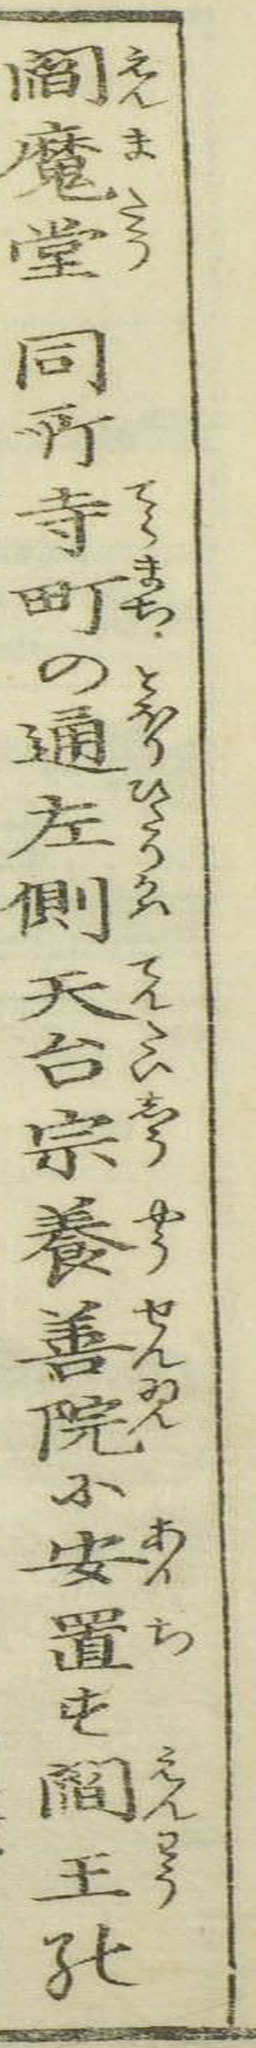閻魔堂同所寺町の通左側天台宗養善院に安置す閻王の
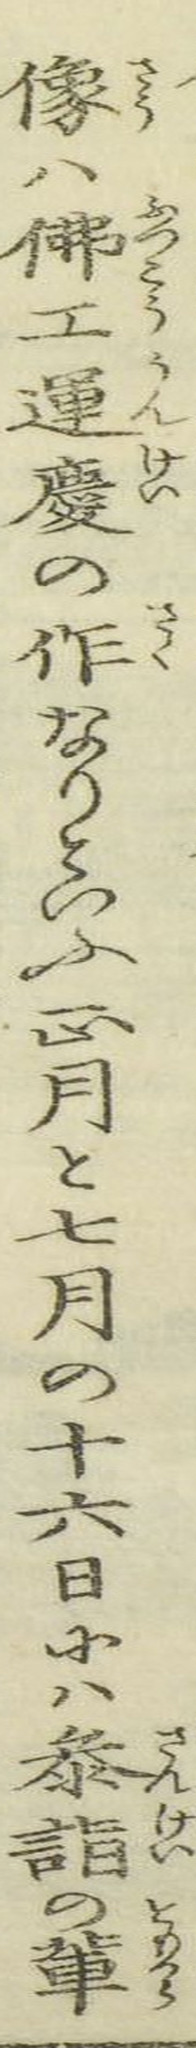像は仏工運慶の作なりといふ正月と七月の十六日には参詣の輩
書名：江戸名所図会 20巻 巻之11
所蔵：東京学芸大学教育コンテンツアーカイブ
